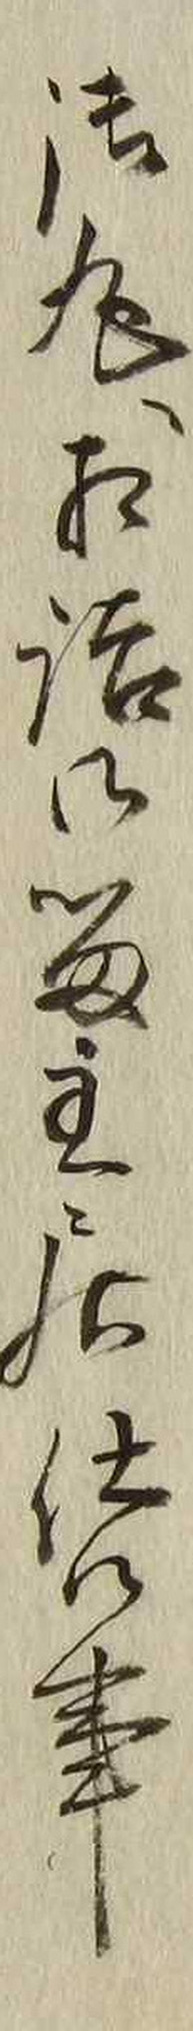御丸へ相詰御留主居仕候事
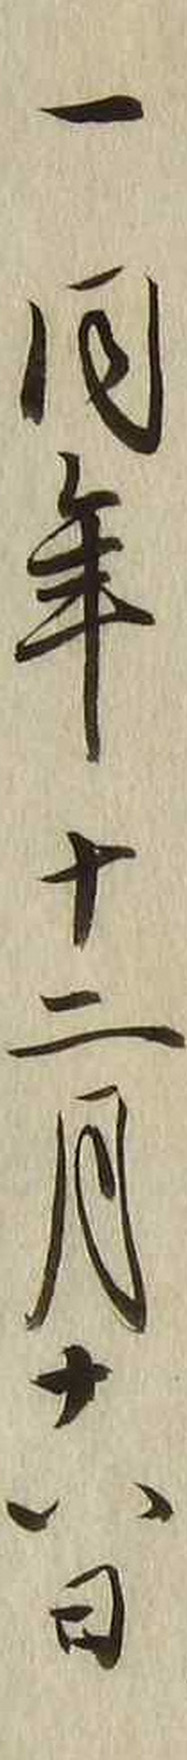一同年十二月十八日
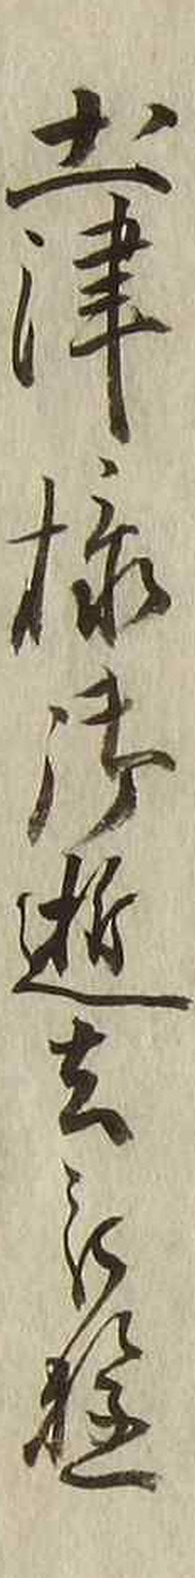土津様御逝去被遊
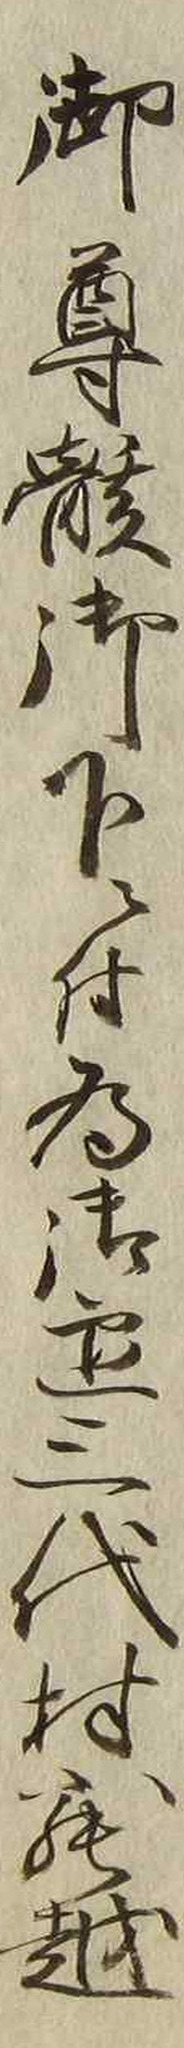御尊骸御下ニ付為御迎三代村罷越
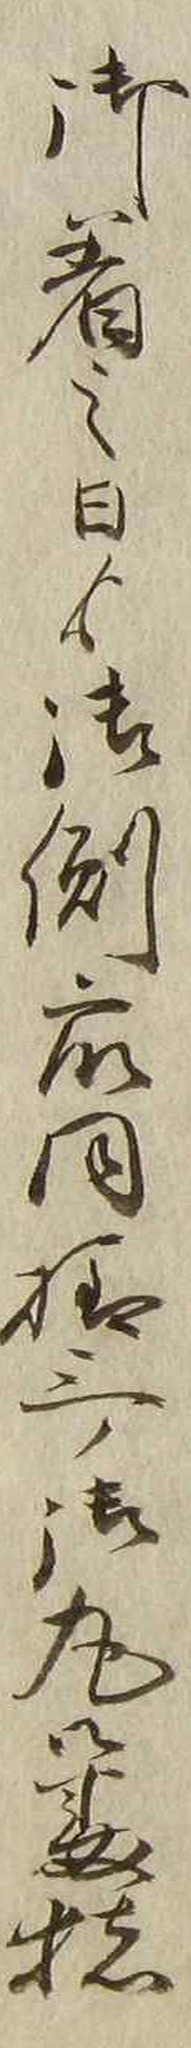御着之日ゟ御側衆同様三ノ御丸御番猪
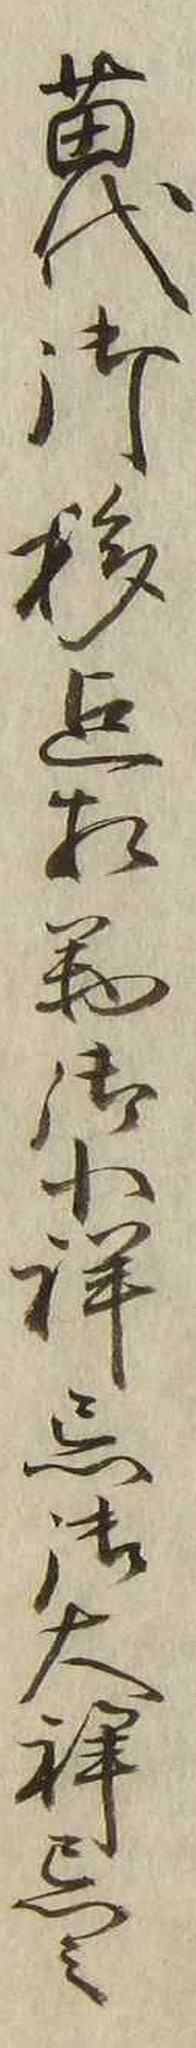苗代御移迄相勤御小祥忌御大祥忌之

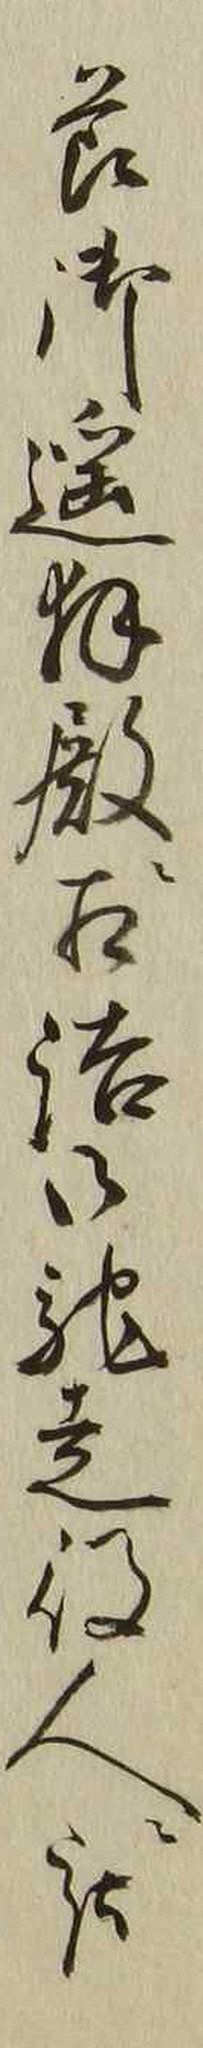節御遥拝殿相詰御馳走役人ニ被
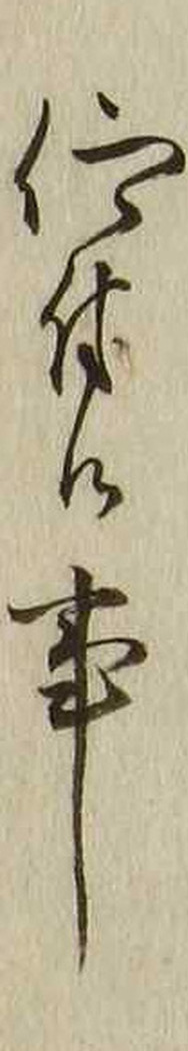仰付候事
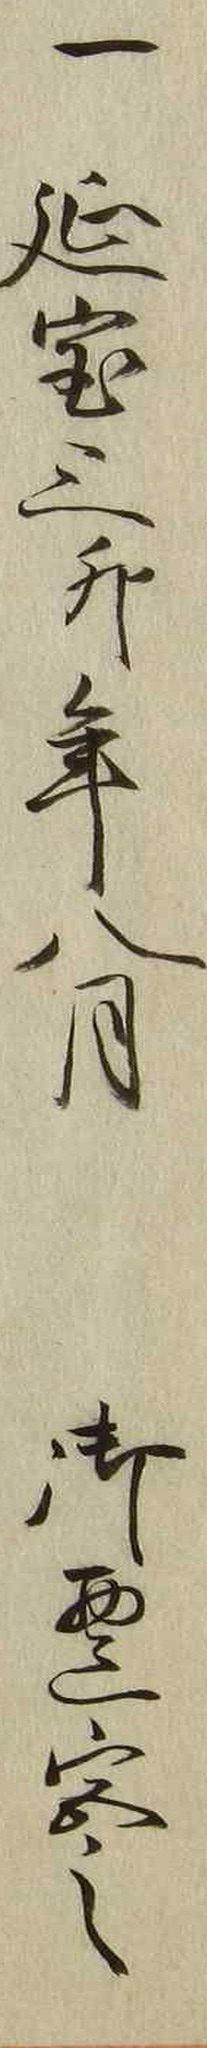一延宝三卯年八月御遷宮之
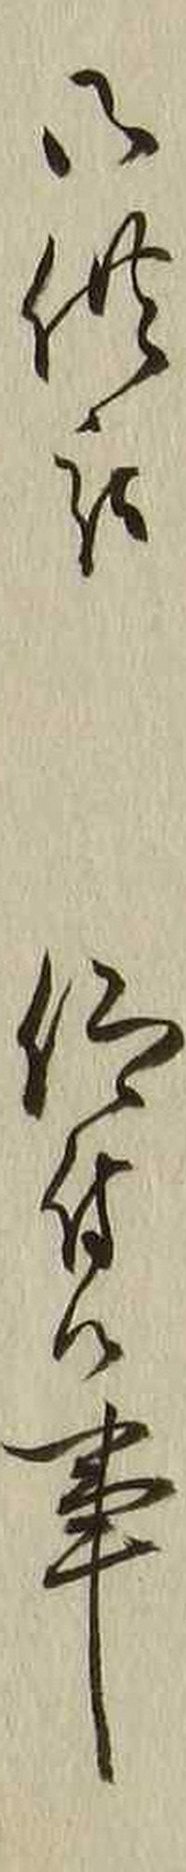御供被仰付候事
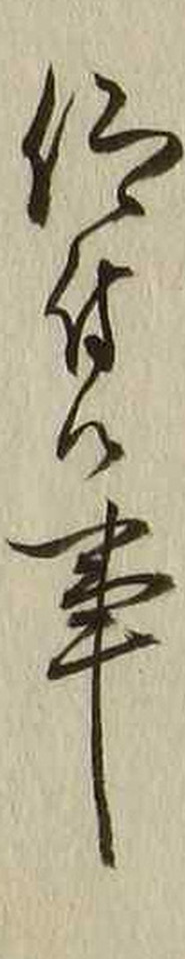仰付候事
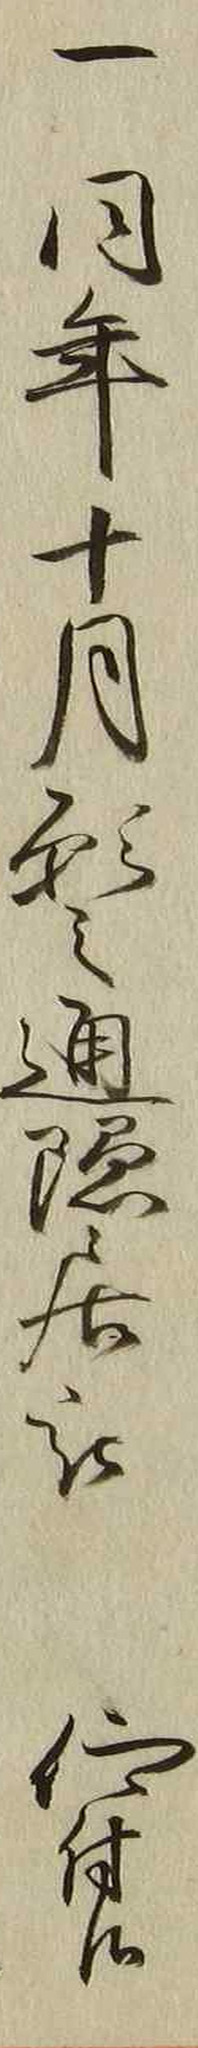一同年十月願之通隠居被仰付候
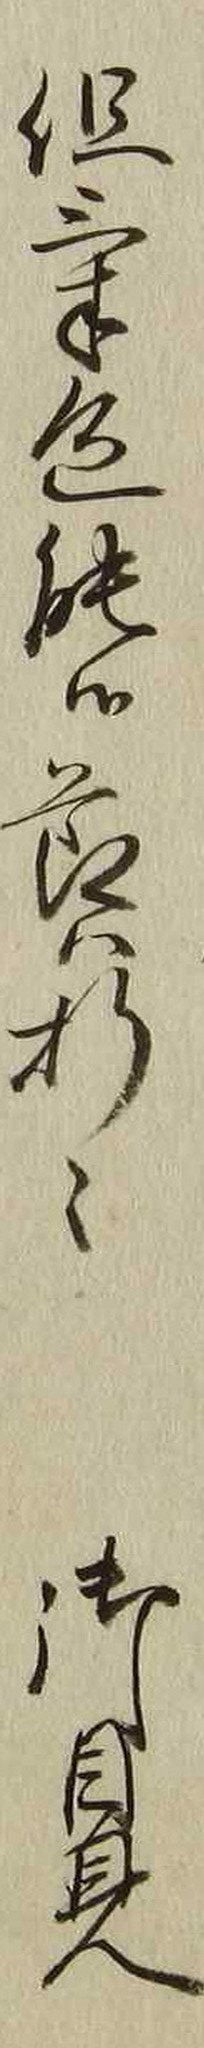但気色能候節ハ折々御目見
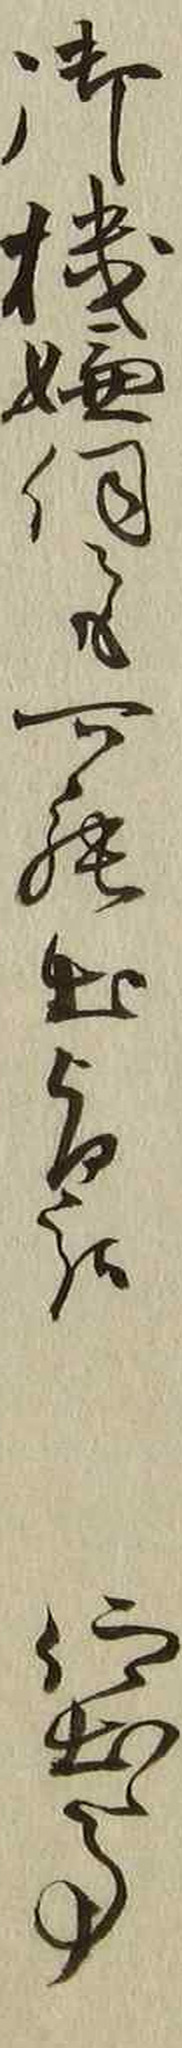御機嫌伺ニも可罷出旨被仰出候事
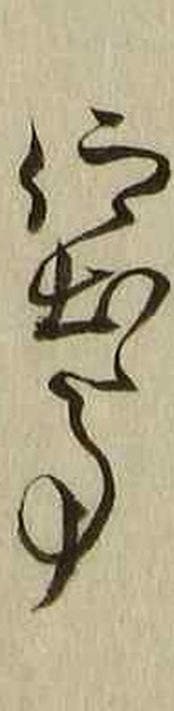仰付候事
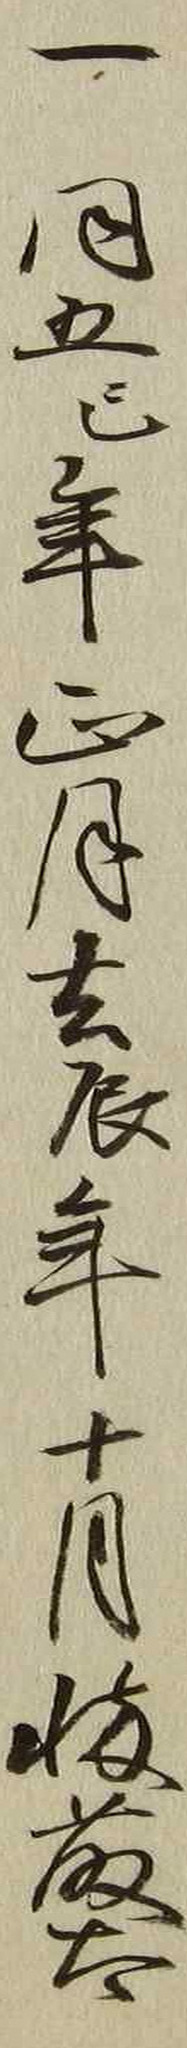一同五巳年正月去辰年十月忰藤太
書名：諸士系譜　巻之60　と之部3
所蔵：会津若松市立会津図書館
